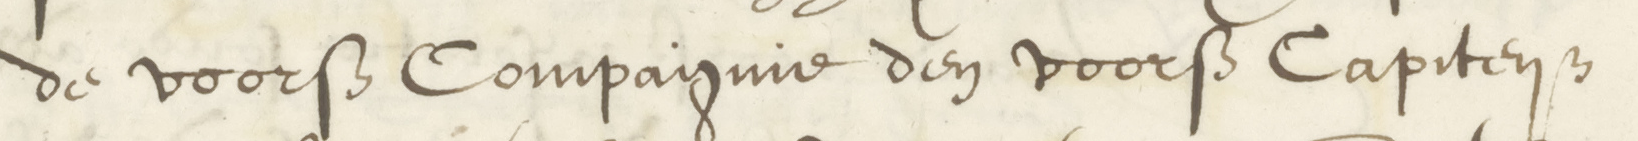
de voors Compaignie den voors Capiteyn
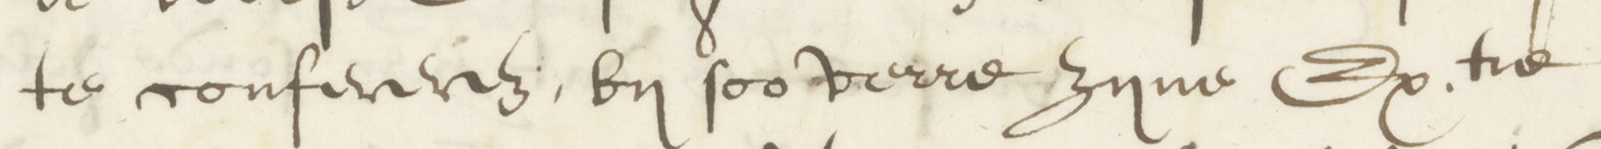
te confereren, by soo verre zjne Extie
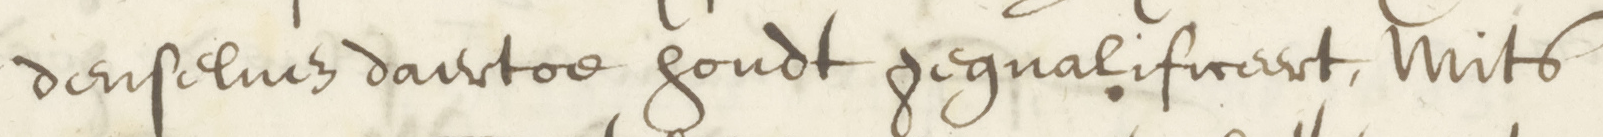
denseluen daertoe houdt gequalificeert, mits
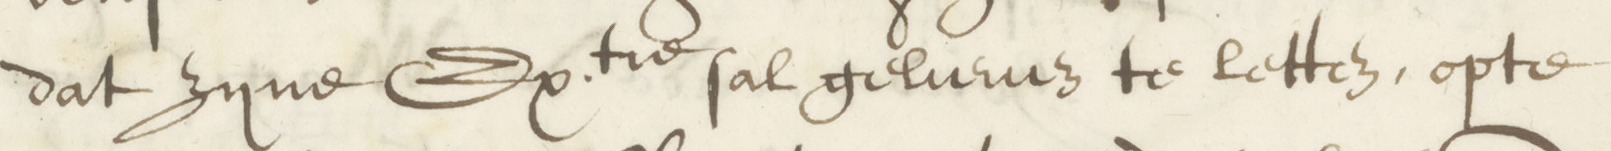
dat zyne Extie sal gelieuen te letten, opte
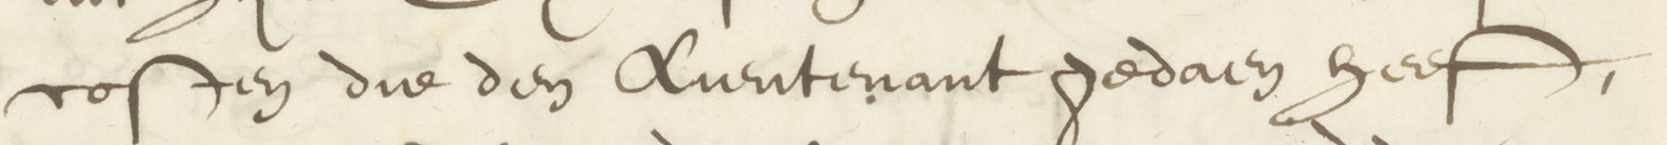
costen die den Lieutenant gedaen heeft,
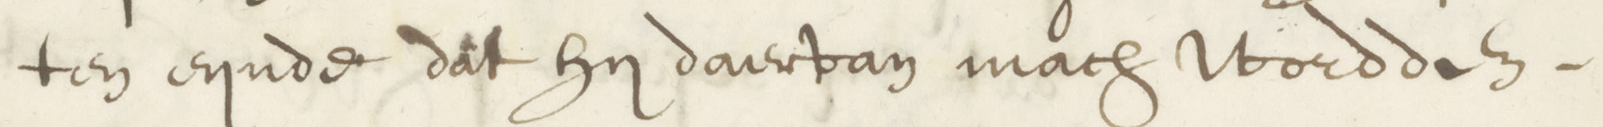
ten eynde dat hy daervan mach wordden
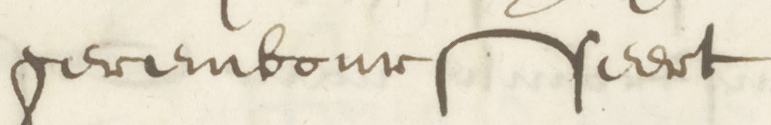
geremboursseert.
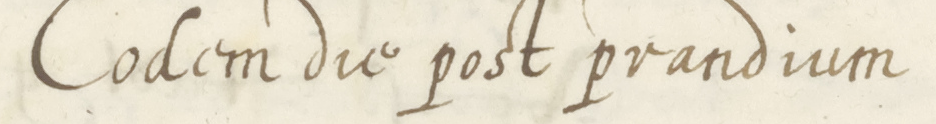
Eodem die post prandium
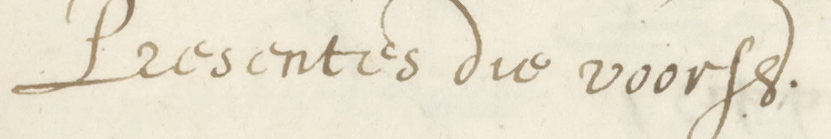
Presentes die voorss.
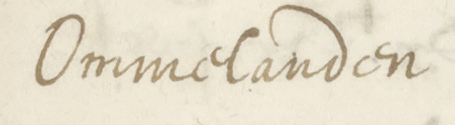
Ommelanden
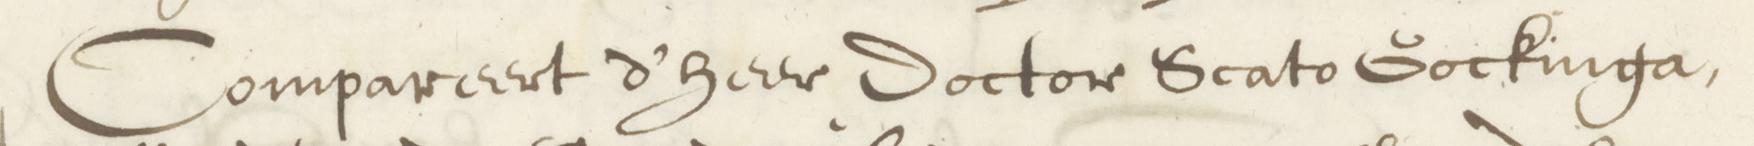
Compareert d'heer Doctor Scato Gockinga,
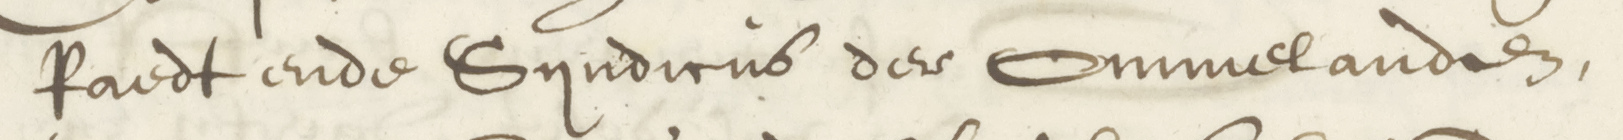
Raedt ende Syndicus der Ommelanden,
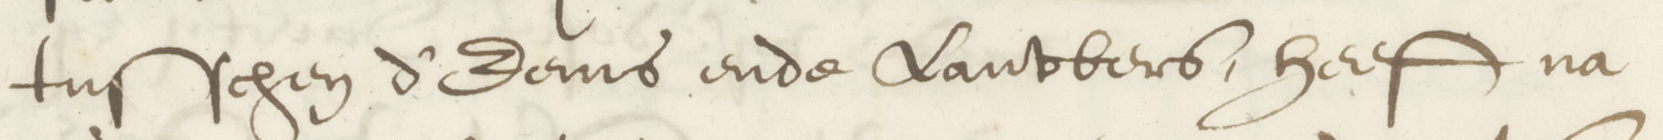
tusschen d'Eems ende Lauwers, heeft na
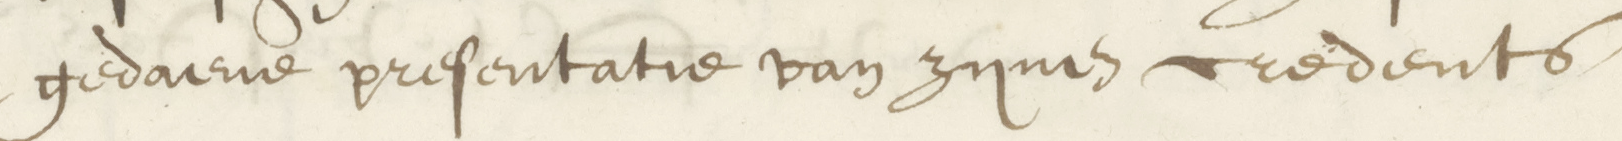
gedaene presentatie van zijnen credents
